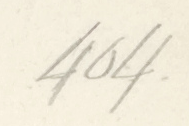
404
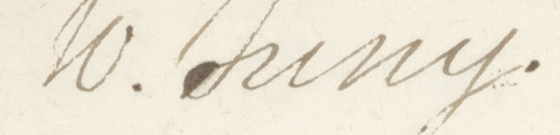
10. Juny.
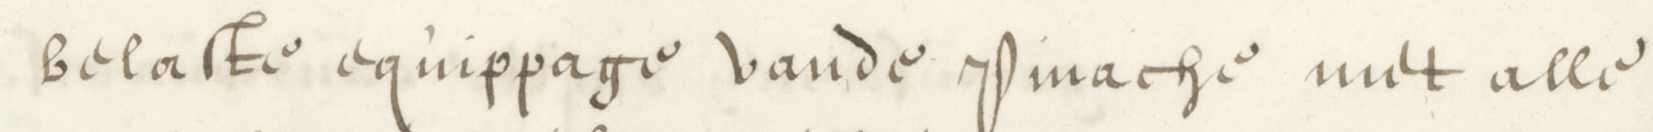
belaste equippage vande Pinache met alle
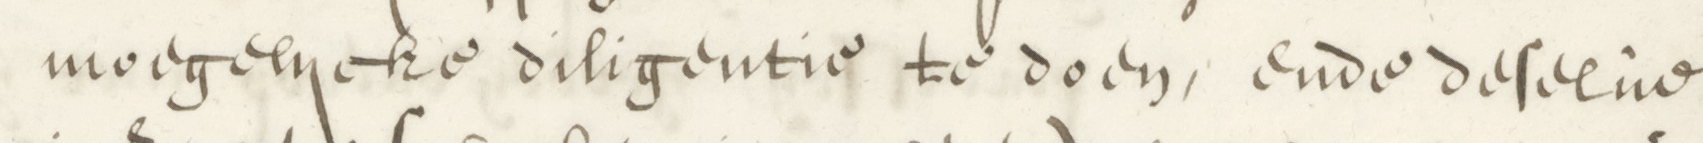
moegelycke diligentie te doen, ende deselue
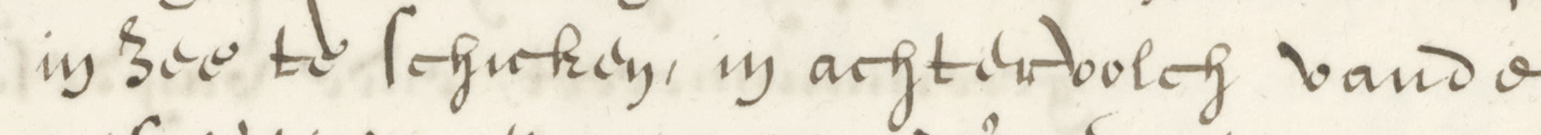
in zee te schicken, in achtervolch vande
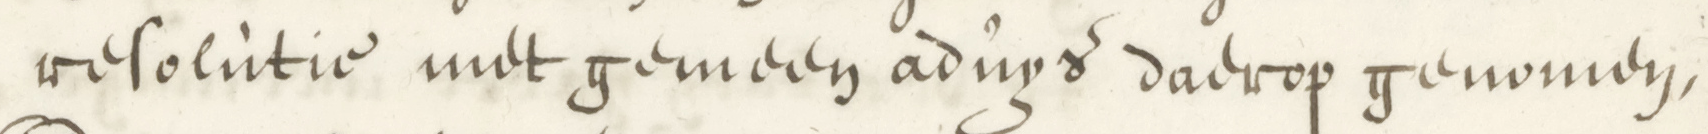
resolutie met gemeen aduys daerop genomen.
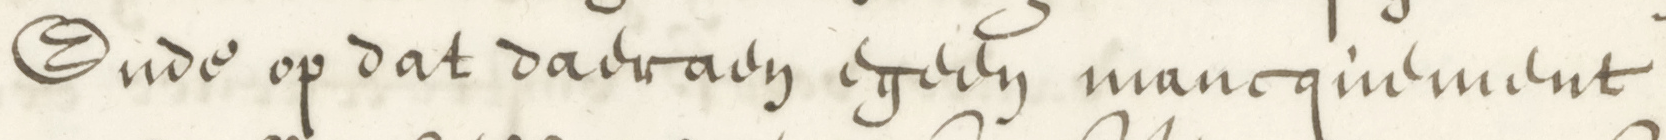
Ende op dat daeraen egeen mancquement
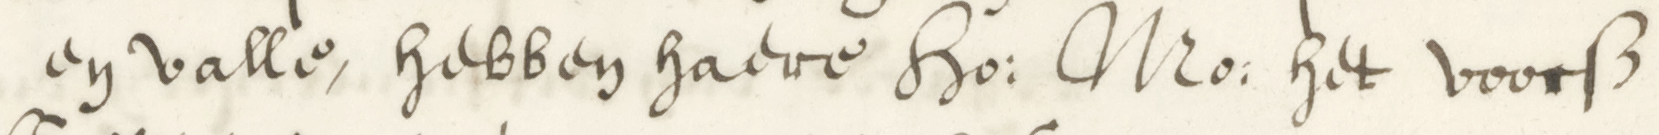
en valle, hebben haere Ho:Mo: het voors
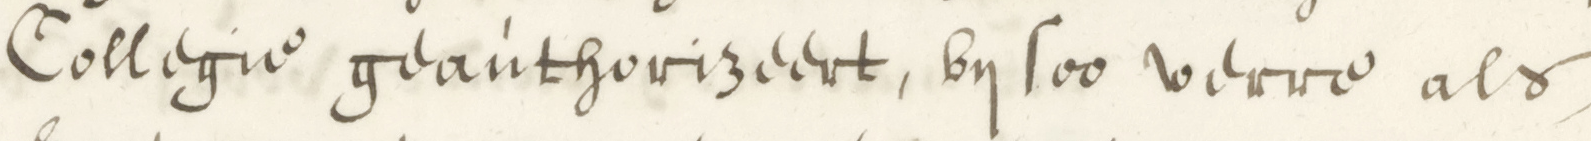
Collegie geauthorizeert, by soo verre als
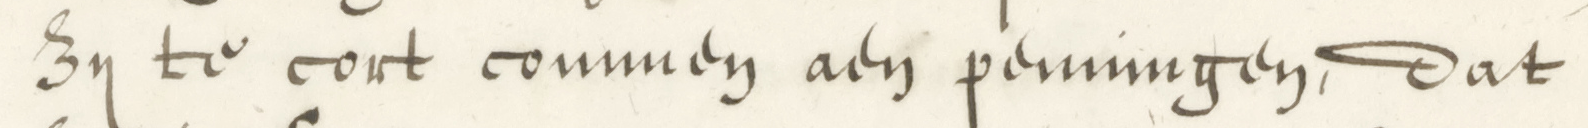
zy te cort commen aen penningen, Dat
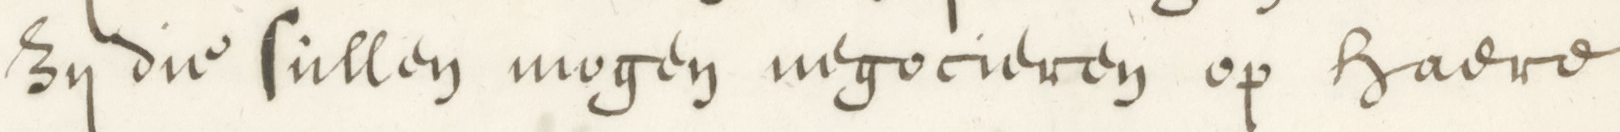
zy die sullen mogen negocieren op haere
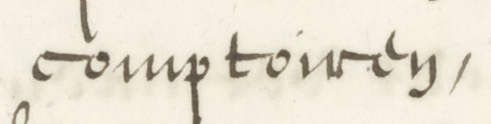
comptoiren.
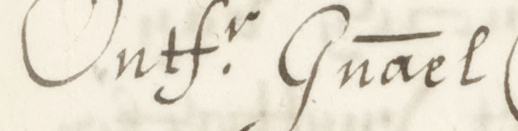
Ontfr. Gnael
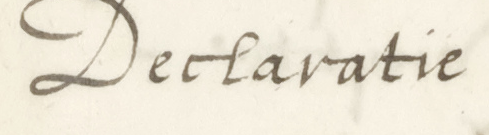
Declaratie
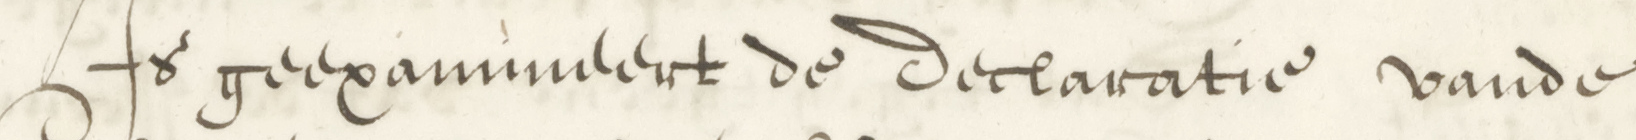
Is geexamineert de declaratie vande
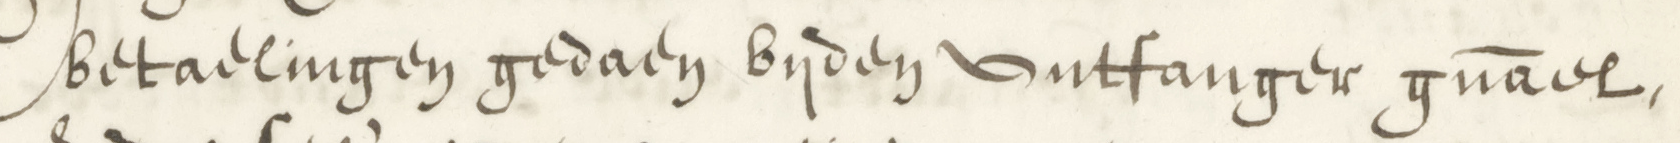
betaelingen gedaen byden Ontfanger gnael,
